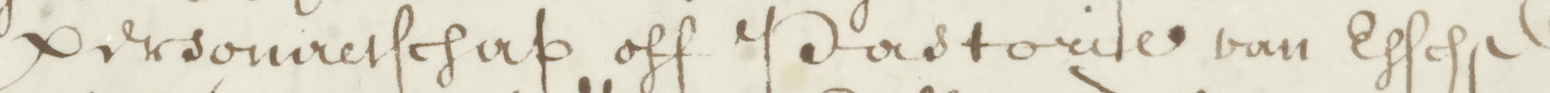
personaetschap off pastorie van Essche
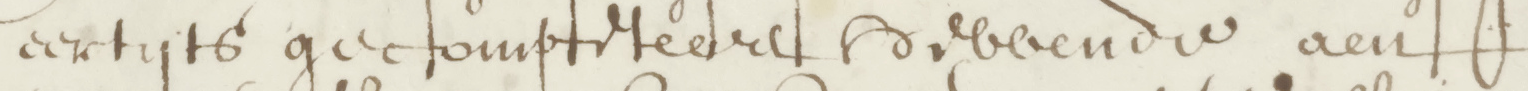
eertijts gecompeteert hebbende aen
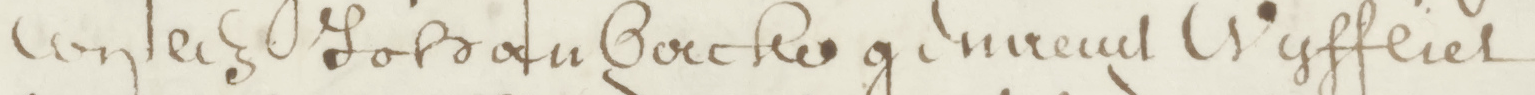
wijlen Johan Backe genaemt Wijffliet
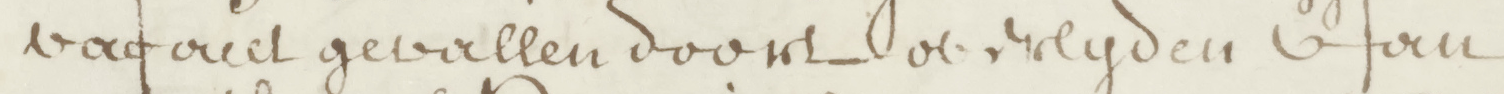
vacant gevallen doort overlijden van
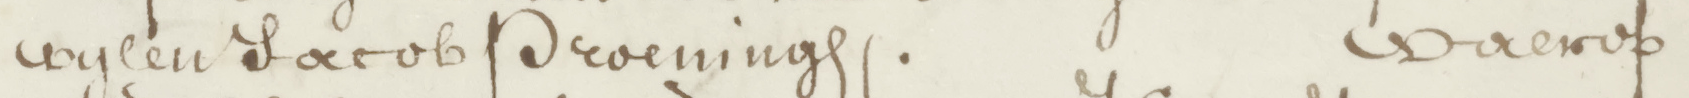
wijlen Jacob Proeningh. Waerop
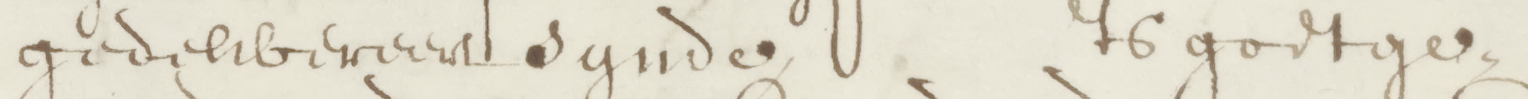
gedelibereert sijnde, Is goetge„
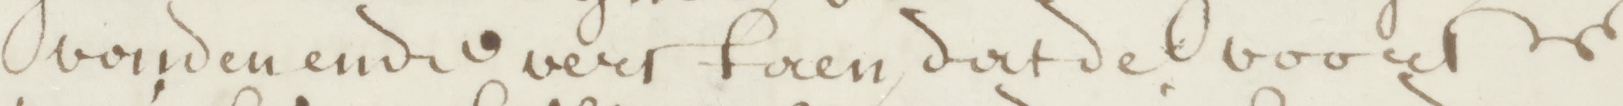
vonden ende verstaen, dat de voors
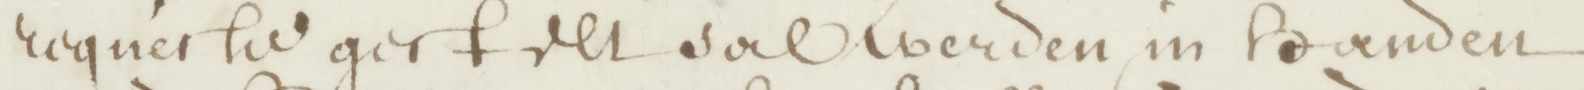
requeste gestelt sal werden in handen
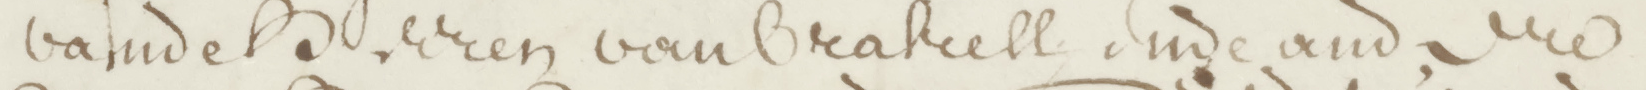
vande heeren van Brakell ende andere
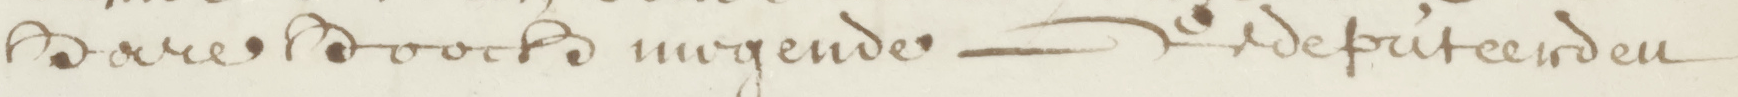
hare Hooch Mogende Gedeputeerden
